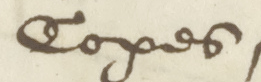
Copes.
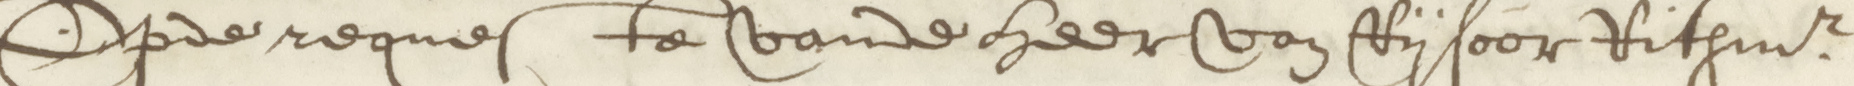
Opde requeste vande heer van Rijsoor Rithmr.
